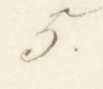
5.
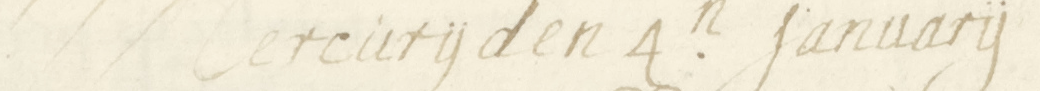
Mercurij den 4n. Januarij 1662
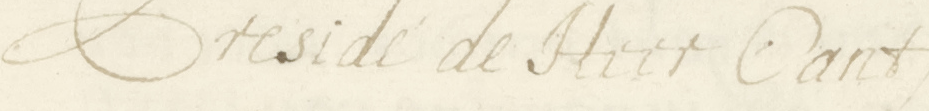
Preside de Heer Cant
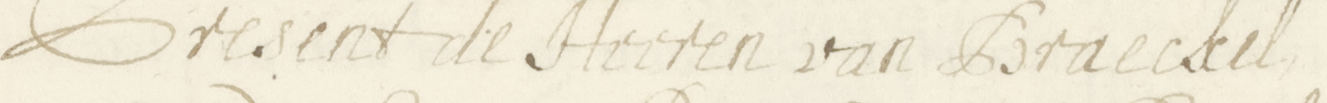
Present de Heeren van Braeckel,
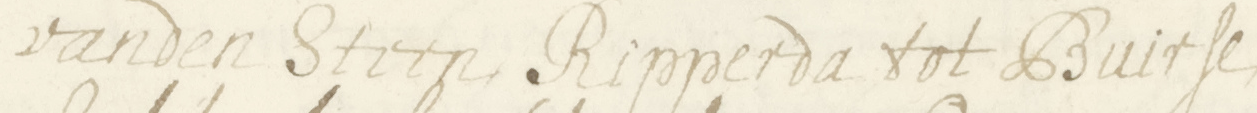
vanden Steen, Ripperda tot Buirse,
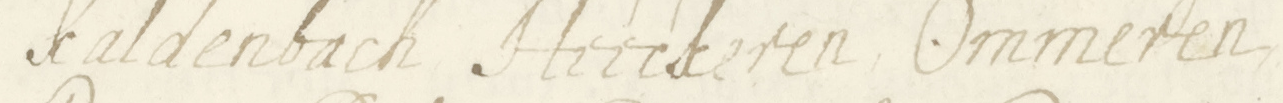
Kaldenbach Heeckeren, Ommeren,
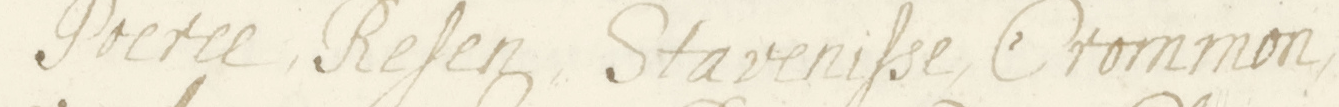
Goeree, Resen, Stavenisse, Crommon,
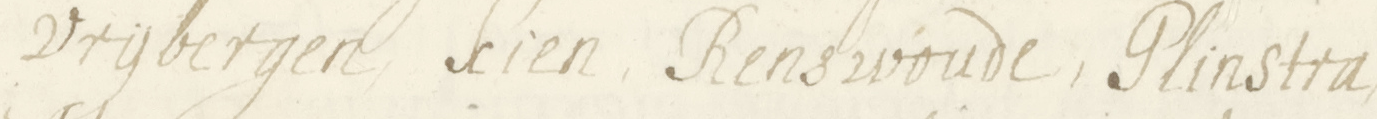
Vrijbergen, kien, Renswoude, Glinstra,
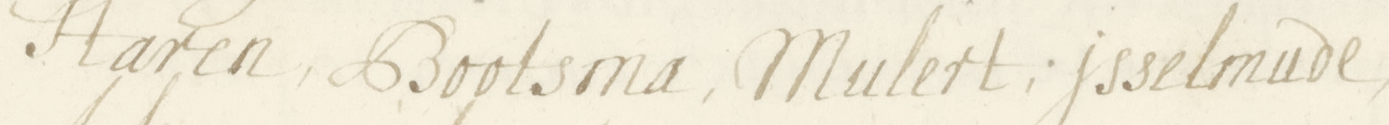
Haren, Bootsma, Mulert, Isselmude,
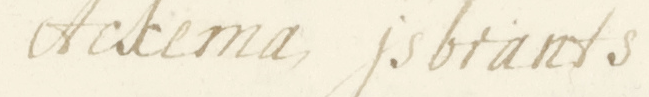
Ackema, Isbrants.
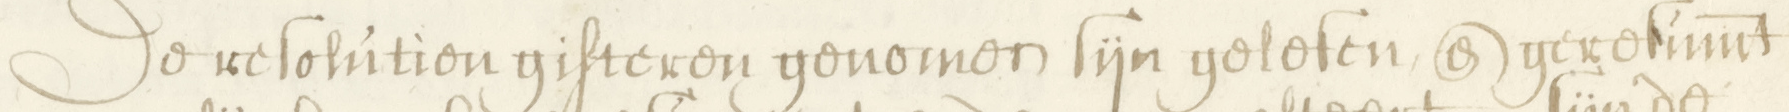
De resolutien gisteren genomen sijn gelesten, & geresumt
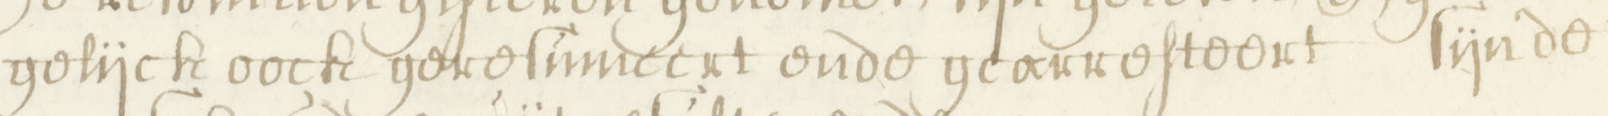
gelijck oock geresumeert ende gearresteert sijn de
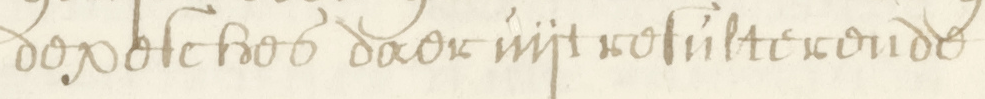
depesches daer uijt resulterende.
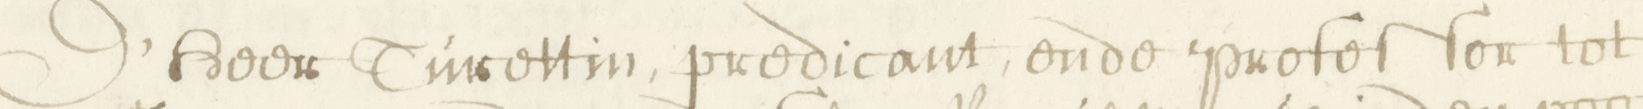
D'heer Turettin, predicant, ende professor tot
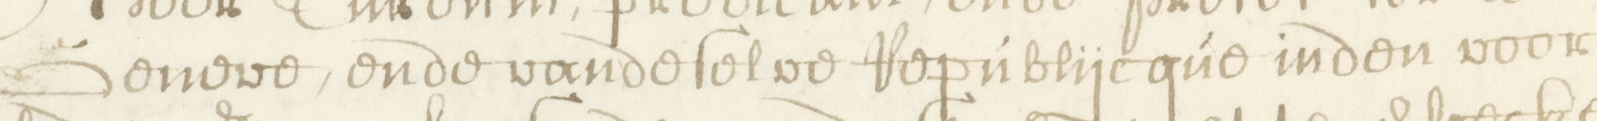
Geneve, ende vandeselve Republijcque inden voor
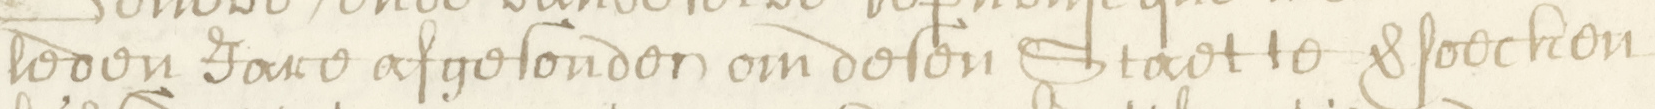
leden Jare afgesonden om desen Staet te vsoecken
